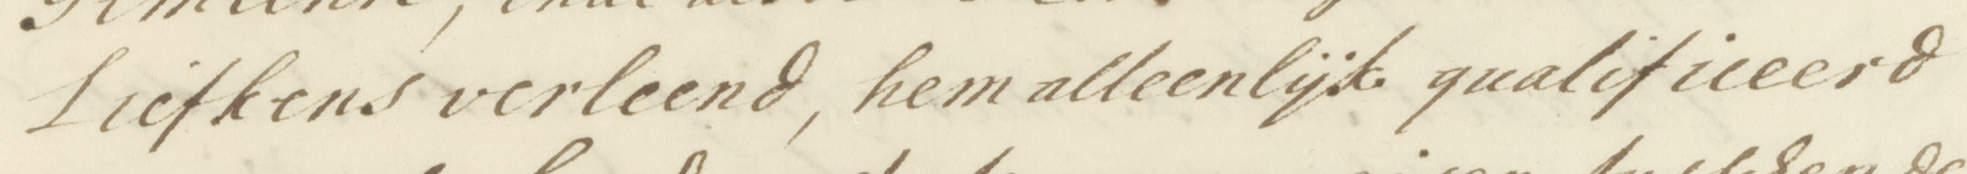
liefkens verleend, hem alleenlijk qualificeerd
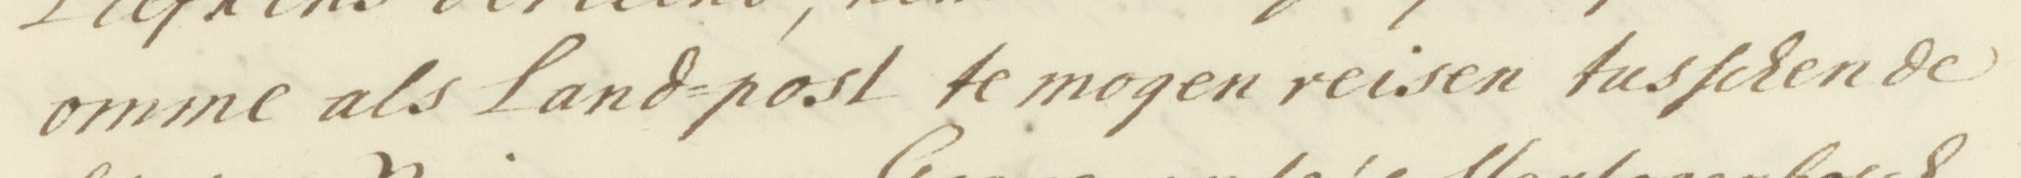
omme als Land-post te mogen reisen tusschen de
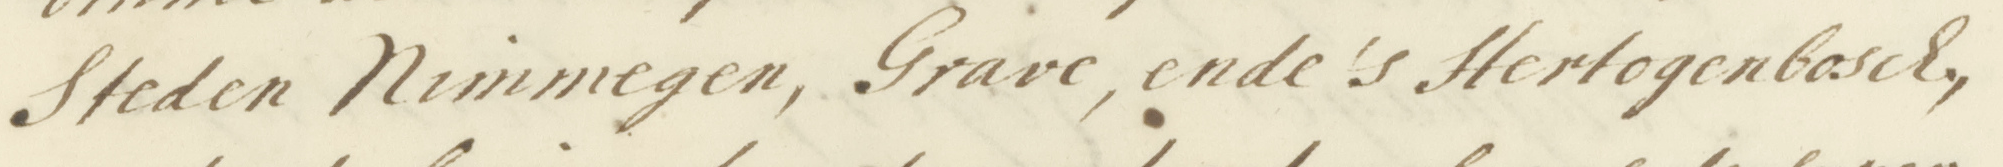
steden Nimmegen, Grave ende 's Hertogenbosch,
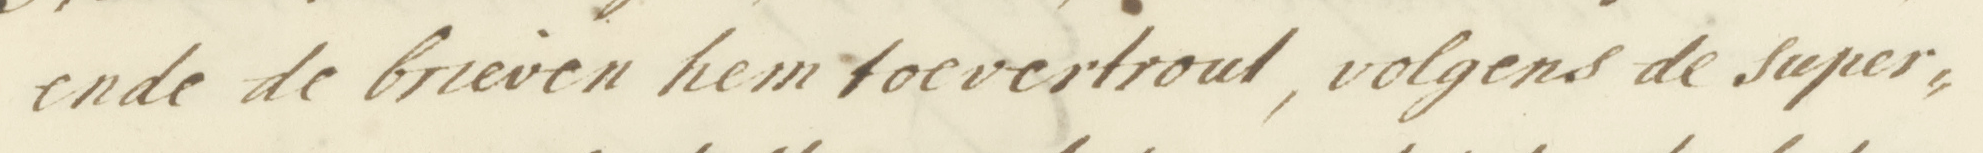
ende de brieven hem toevertrout, volgens de super„
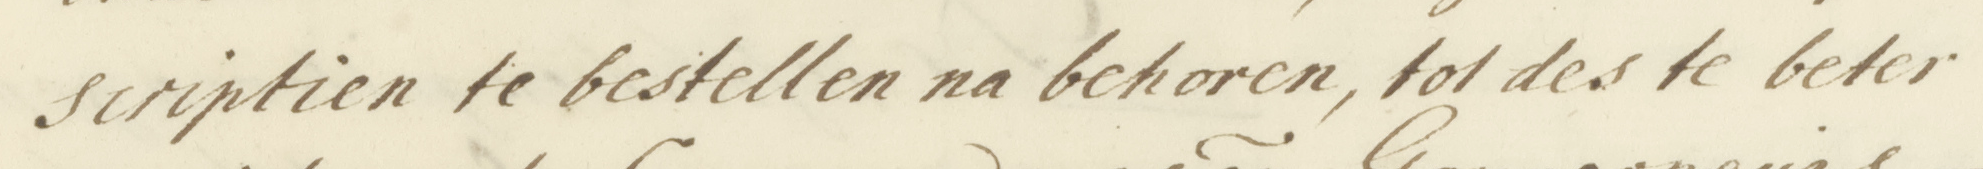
scriptien te bestellen na behoren, tot des te beter
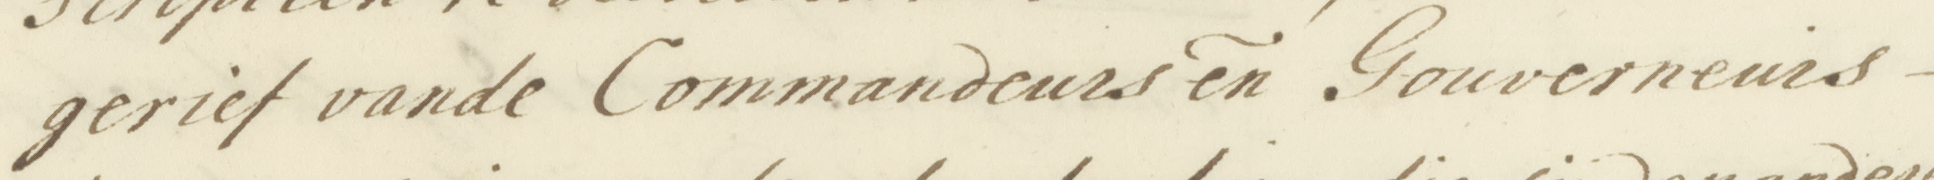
gerief vande Commandeurs en Gouverneurs
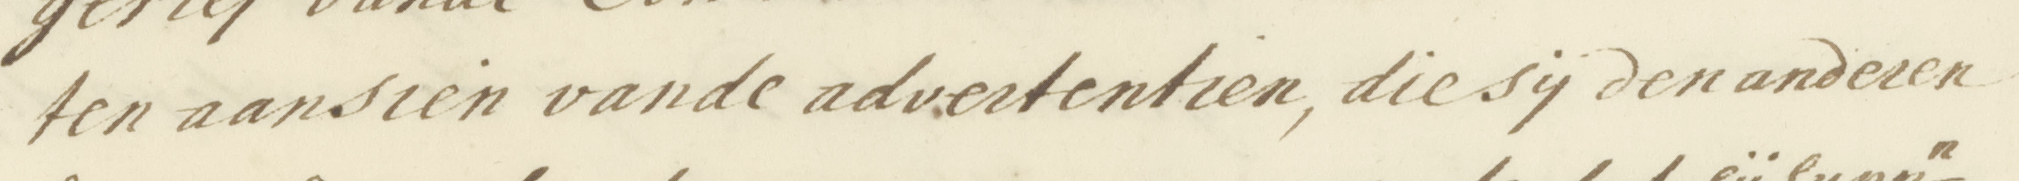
ten aansien vande advertentien, die sij den anderen
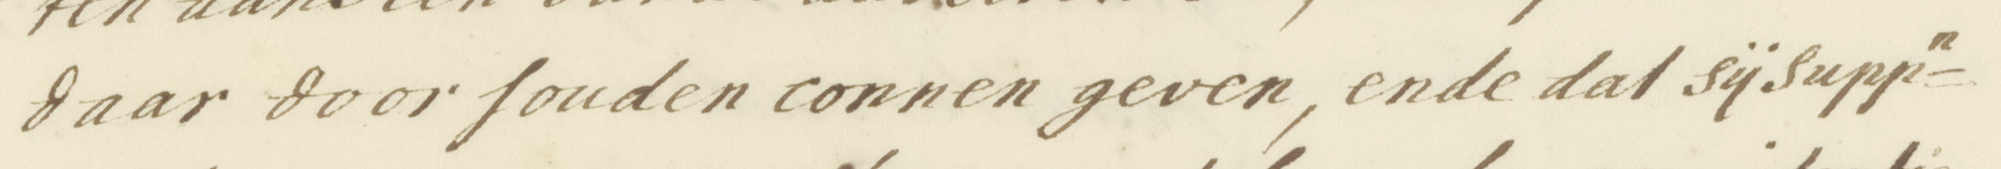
daar door souden connen geven, ende dat sij suppn.
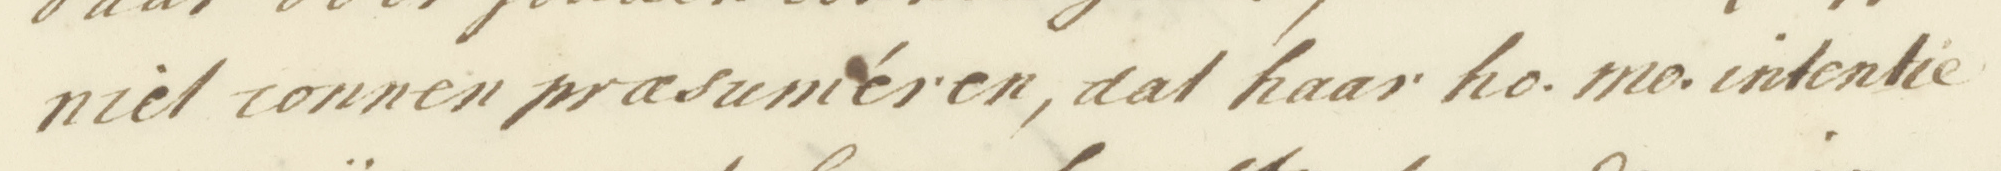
niet connen præsumeren, dat haar ho. mo. intentie
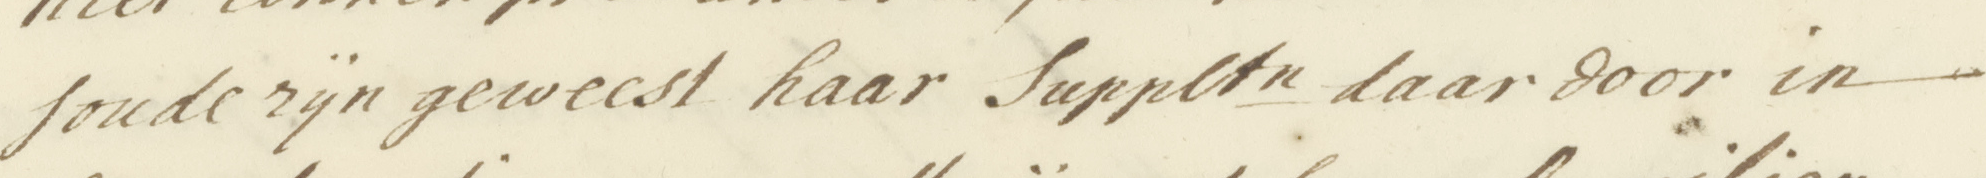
soude zijn geweest haar suppltn. daar door in
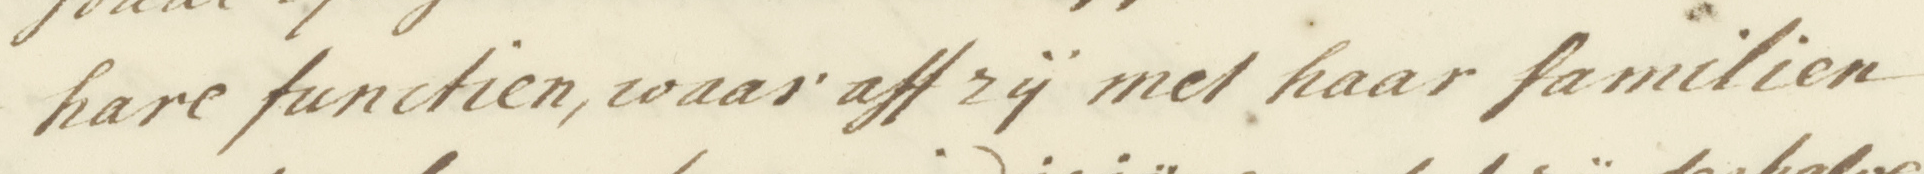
hare functien, waar aff zij met haar familien
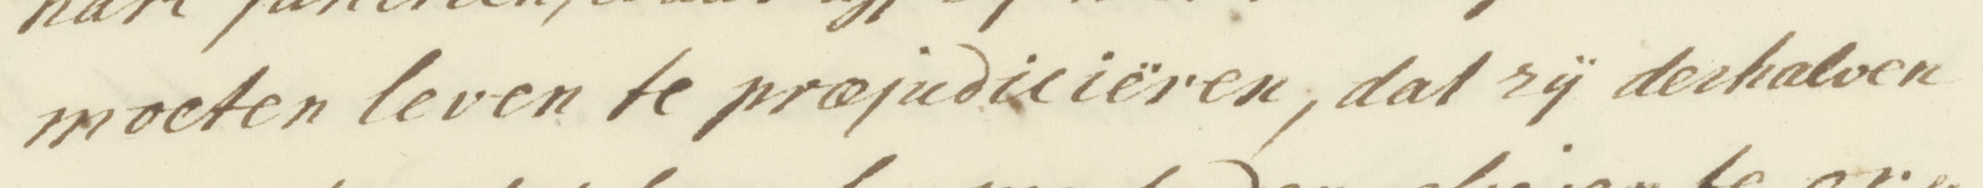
moeten leven te præjudiciëren, dat zij derhalven
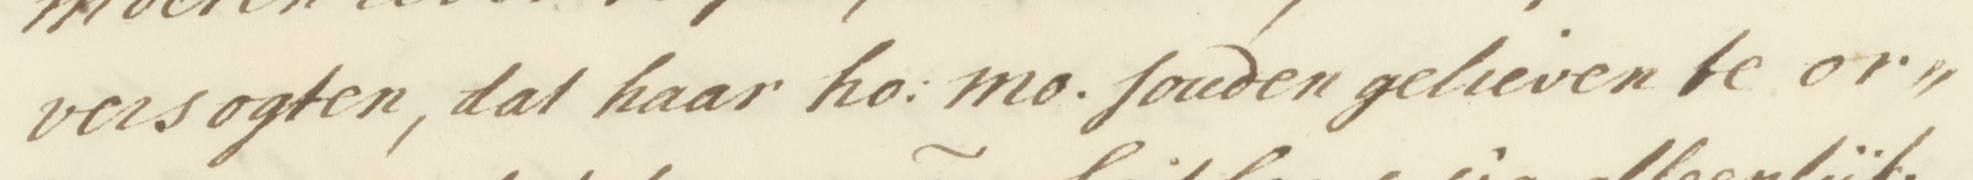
versogten, dat haar ho:mo. souden gelieven te or„
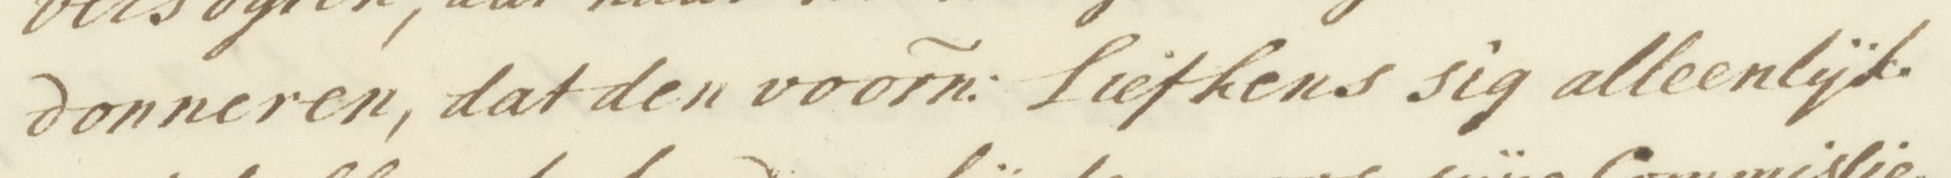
donneren, dat den voorn: Liefkens sig alleenlijk
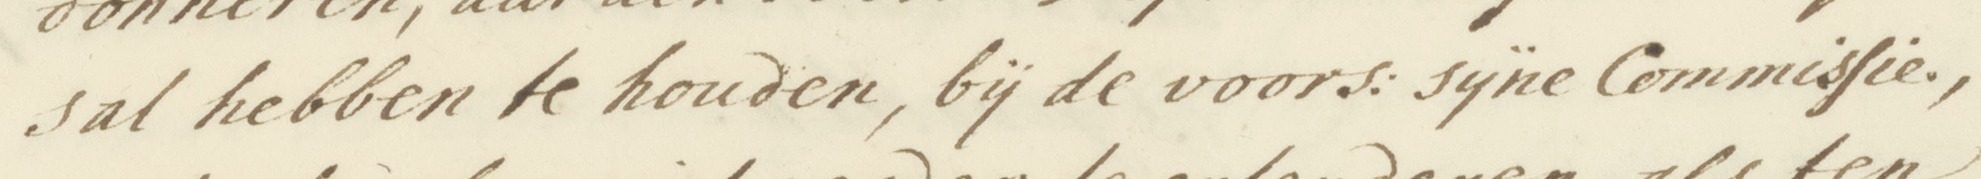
sal hebben te houden, bij de voors: sijne commissie,
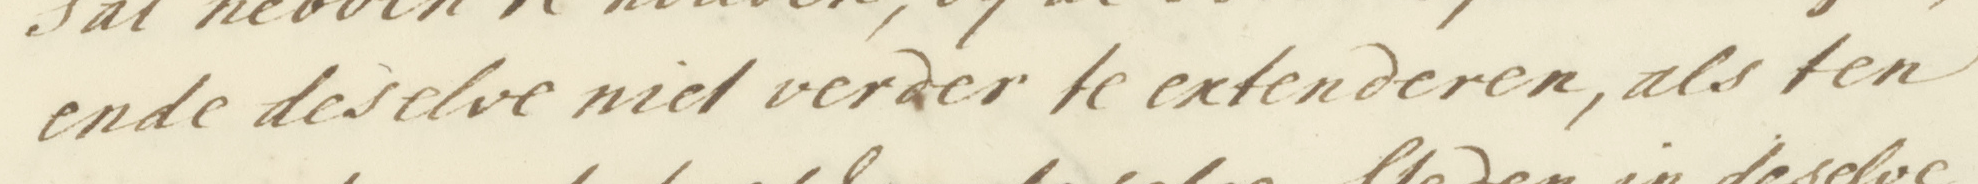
ende deselve niet verder te extenderen, als ten
